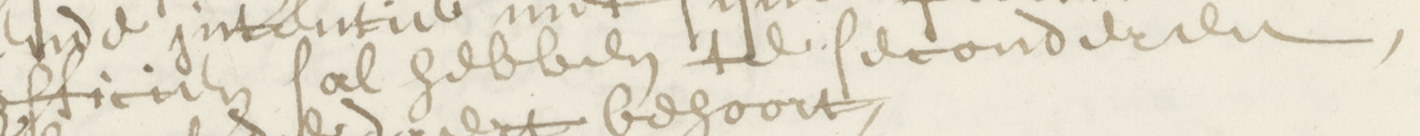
officien sal hebben te seconderen,
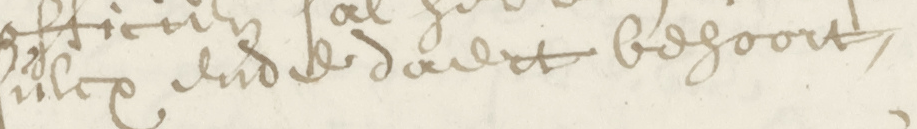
sulcx ende daert behoort.
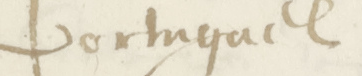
Portugael
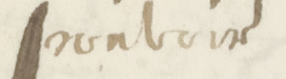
pouvoir
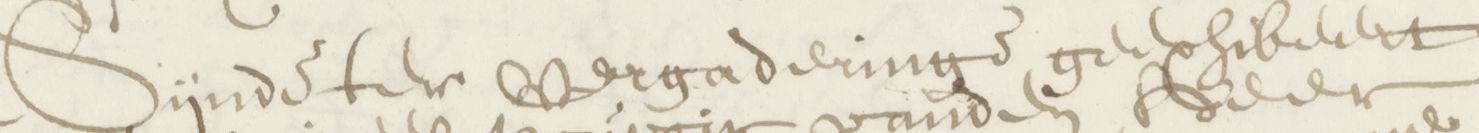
Sijnde ter Vergaderinge geexhibeert
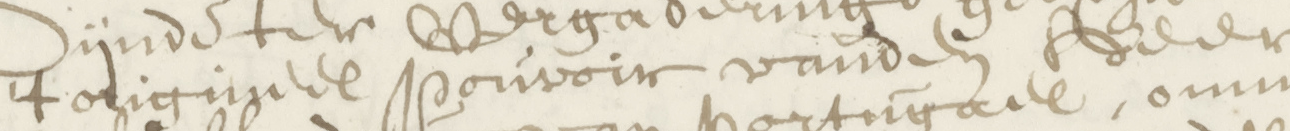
't origineel pouvoir vanden Heer
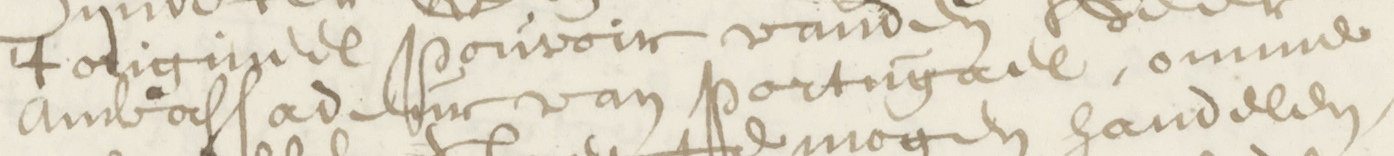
Ambassadeur van portugael, omme
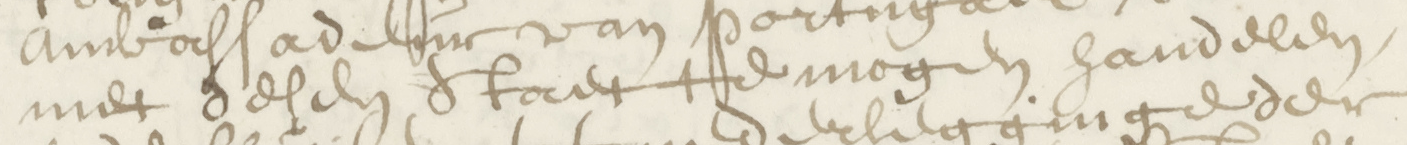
met desen Staet te mogen handelen,
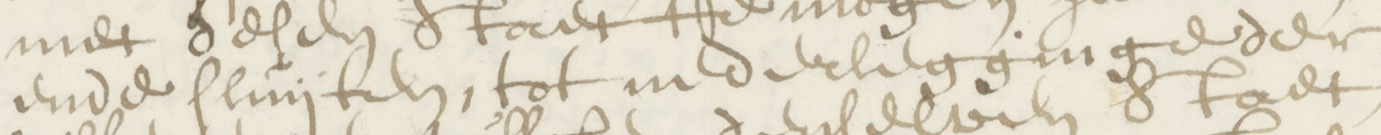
ende sluijten, tot nederlegginge der
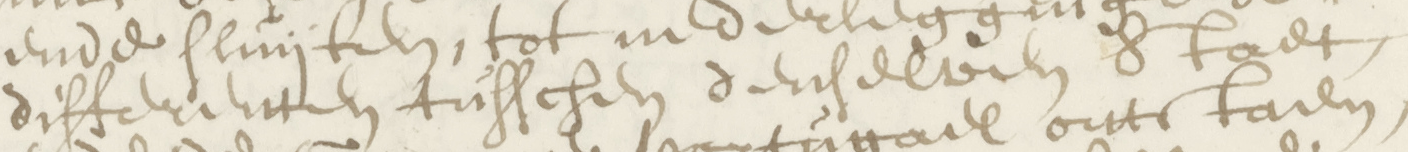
differenten tusschen denselven Staet,
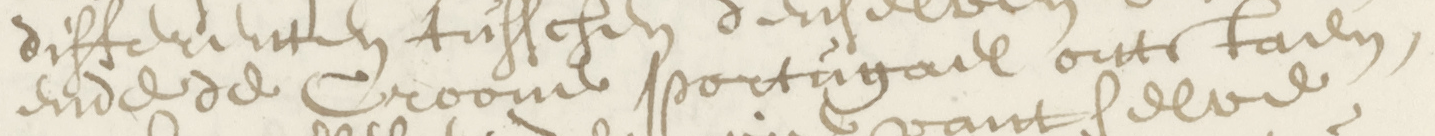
ende de Croone portugael ontstaen,
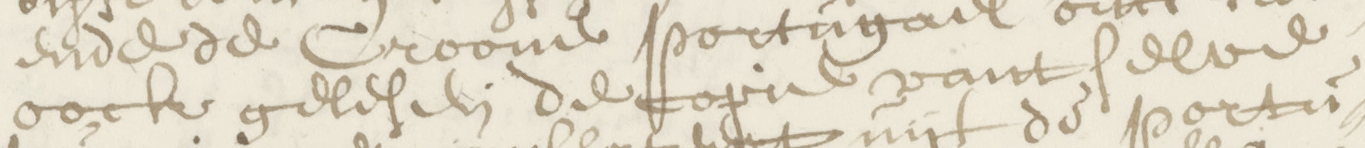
oock gelesen de copie vant selve,
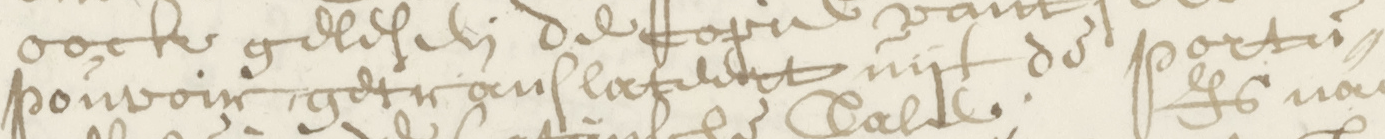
pouvoir, getranslateert uijt de portu,,
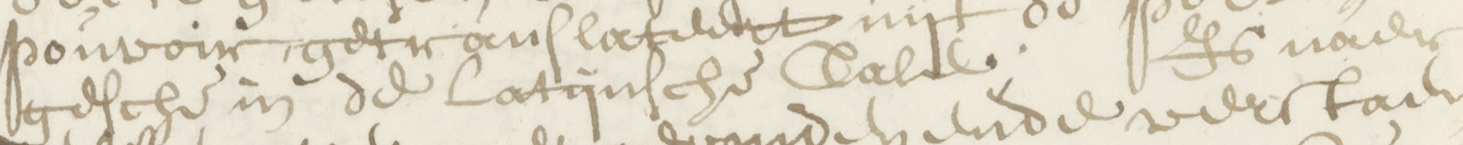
gesche in de Latijnsche Tale. Is naer
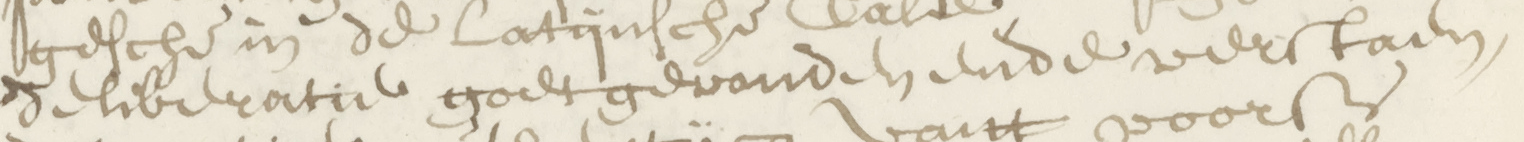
deliberatie goetgevonden ende verstaen,
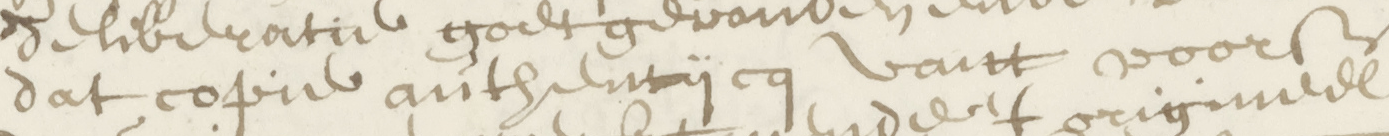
dat copie authentijcq vant voors
